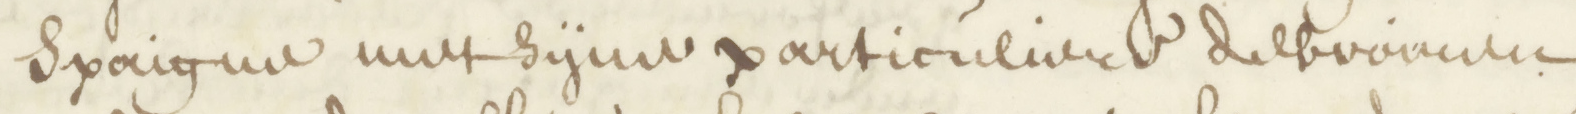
Spaigne met sijne particuliere debvoiren
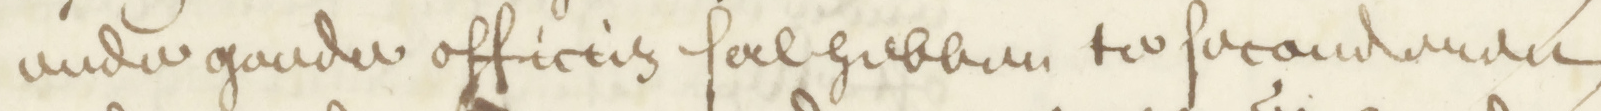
ende goede officien sal hebben te seconderen
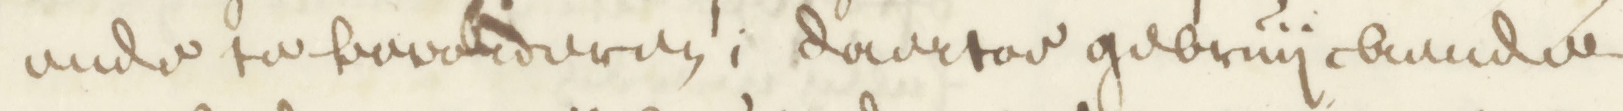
ende te bevorderen; daertoe gebruijckende
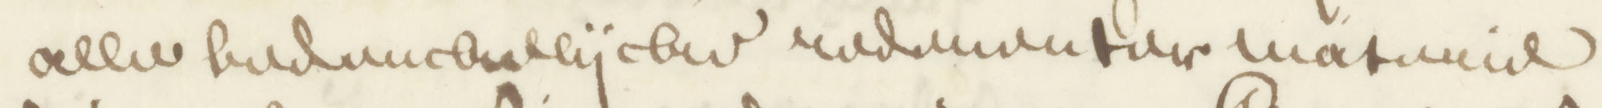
alle bedenckelijcke redenen ter materie
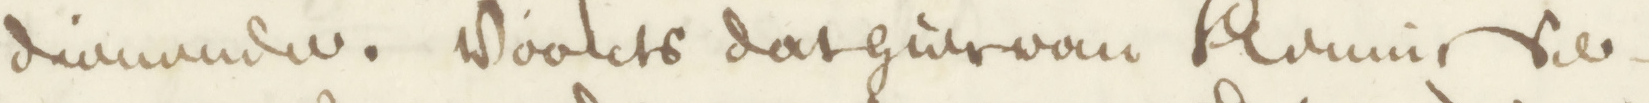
dienende. Voorts dat hier van Kennisse
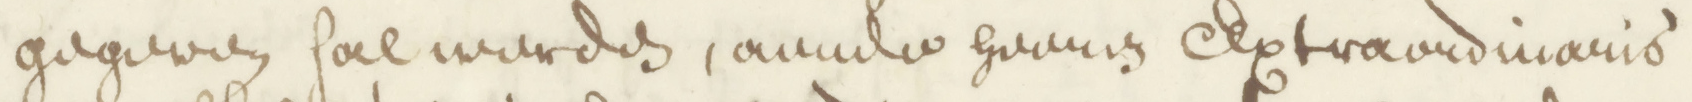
gegeven sal werden, aende heeren Extraordinaris
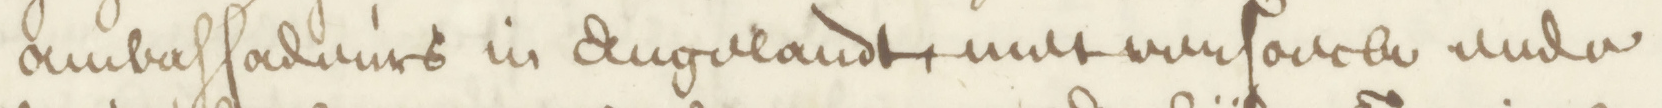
ambassadeurs in Engelandt, met versoeck ende
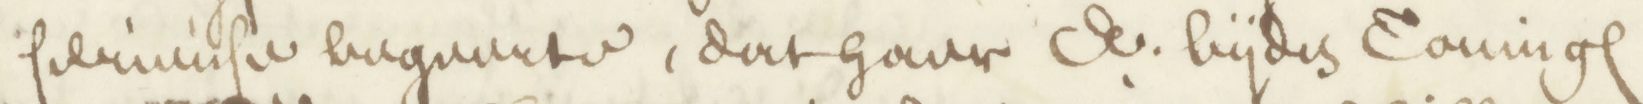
serieuse begeerte, dat haer E. bijden Coningh
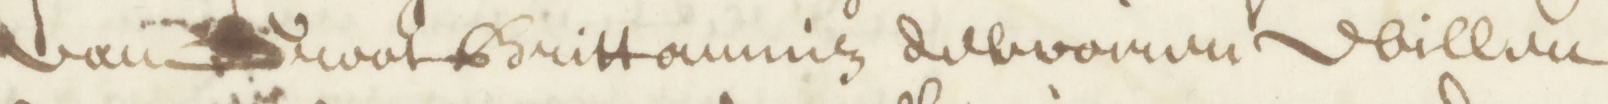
van Groot Brittannien debvoiren willen
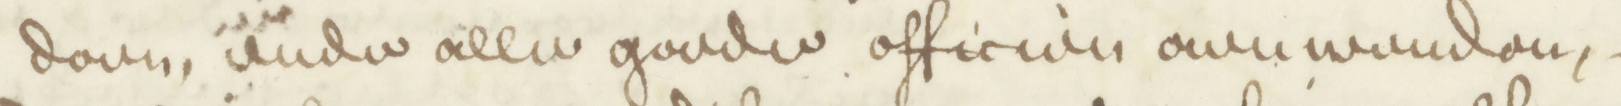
doen, ende alle goede officien aenwenden,
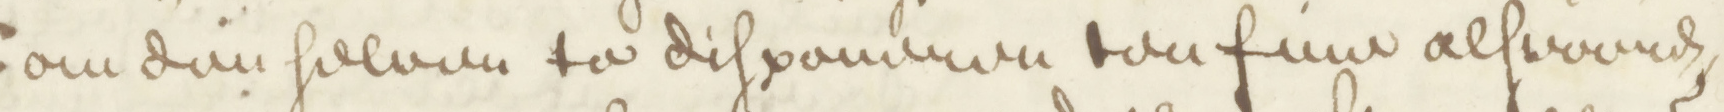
om den selven te disponeren ten fine alsvoeren,
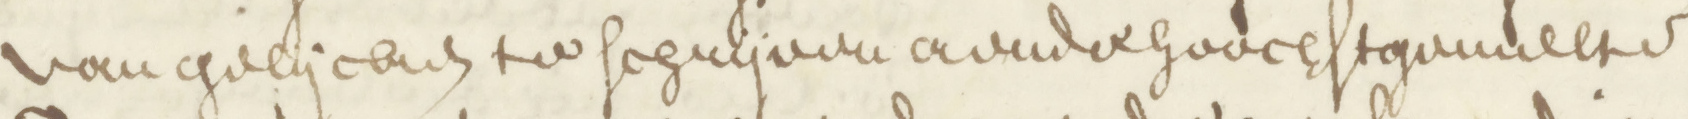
van gelijcken te schrijven aende hoochstgemelte
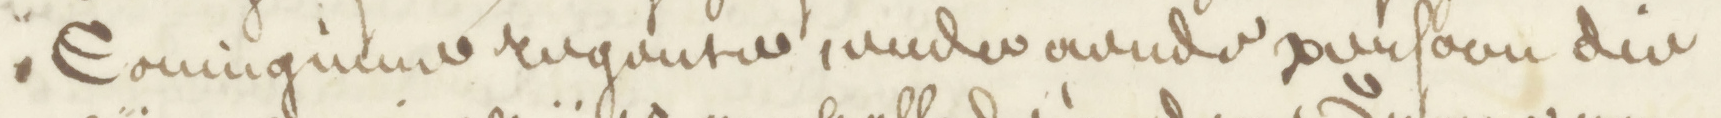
Coninginne regente, ende aende persoon die
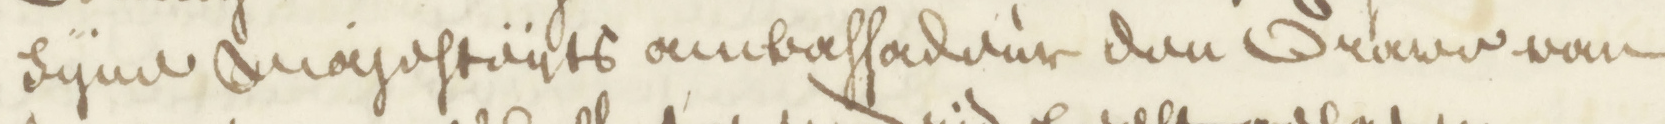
sijne Majesteijts ambassadeur den Grave van
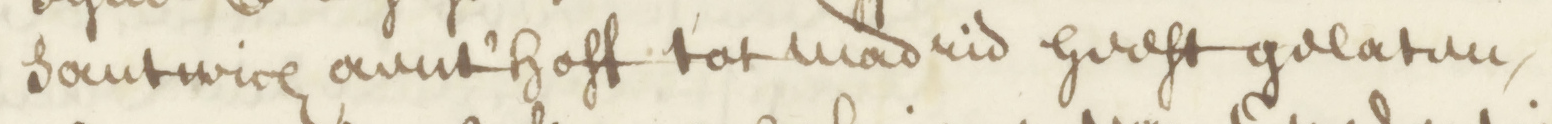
Santwich aent' hoff tot madrid heeft gelaten,
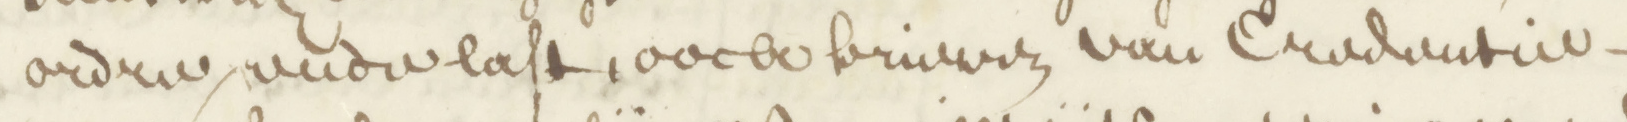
ordre, ende last, oock brieven van Credentie
